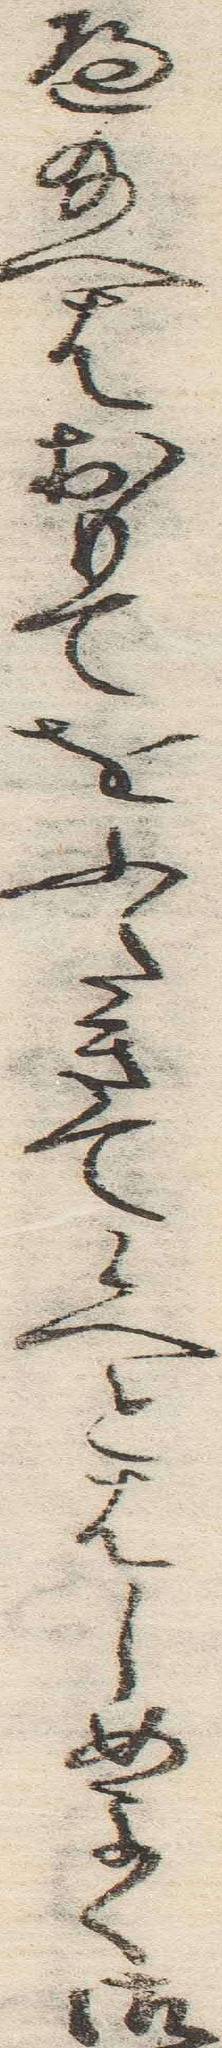へ給へはおもてをふたきて候へとはしめよく御
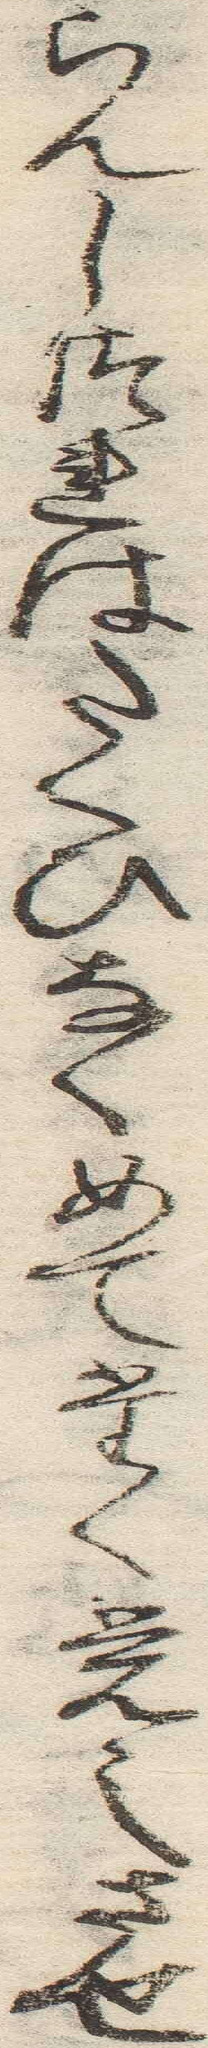らんしされはたくひなくめてたく覚えさせ
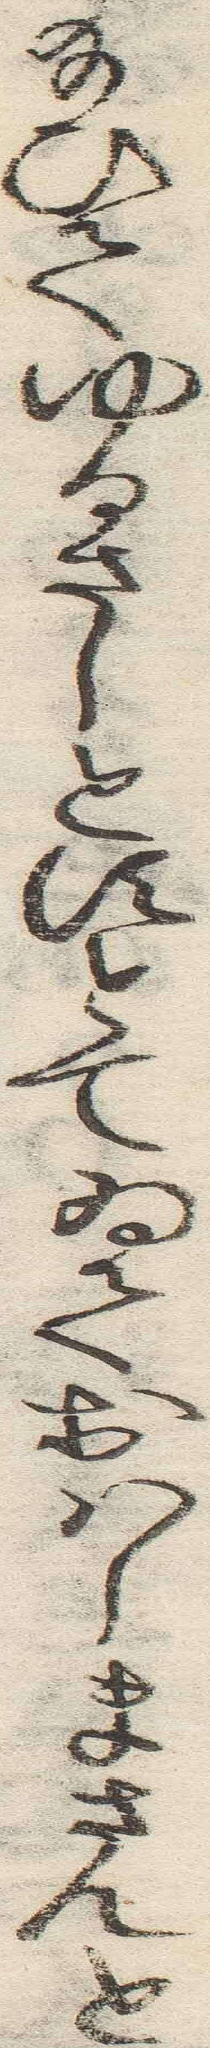給ひてゆるさしとすとてゐておはしまさんと
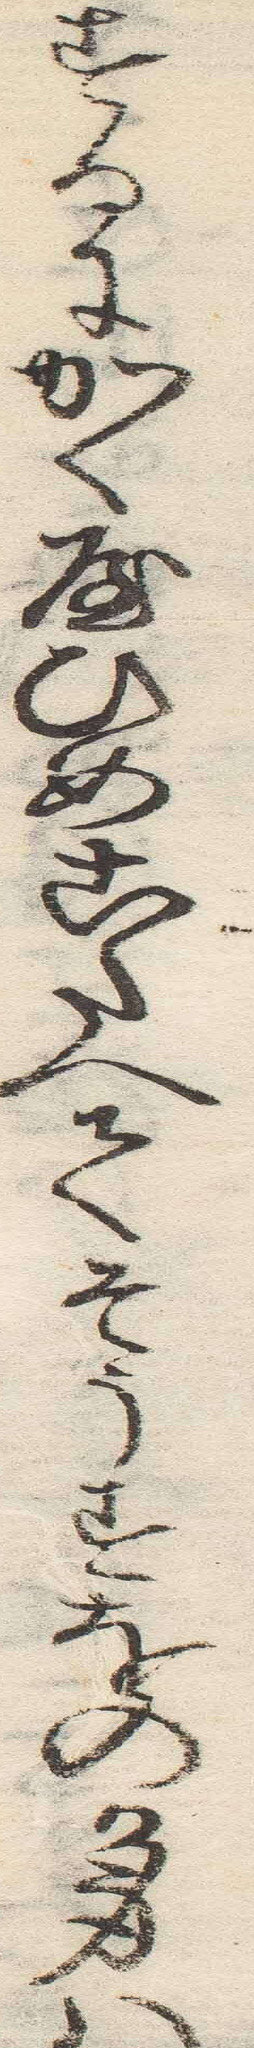するにかくやひめこたへてそうすををのか身は
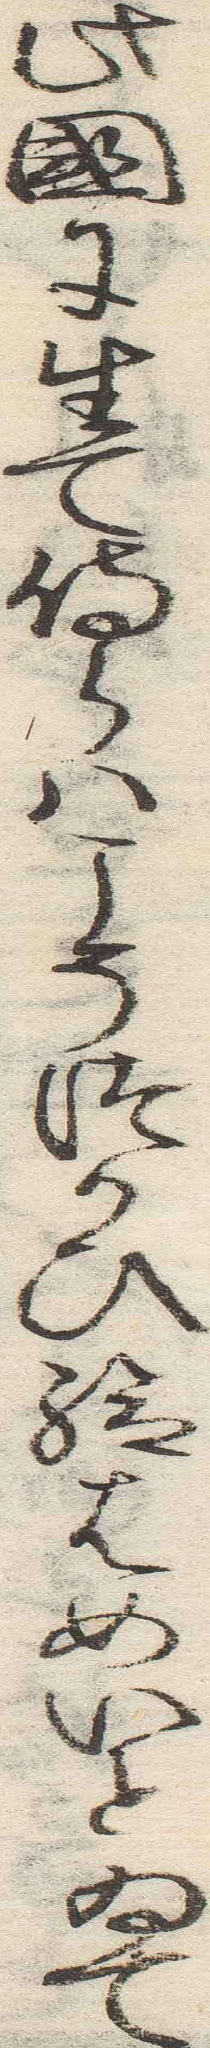此国に生て侍らはこそつかひ給はめいとゐて
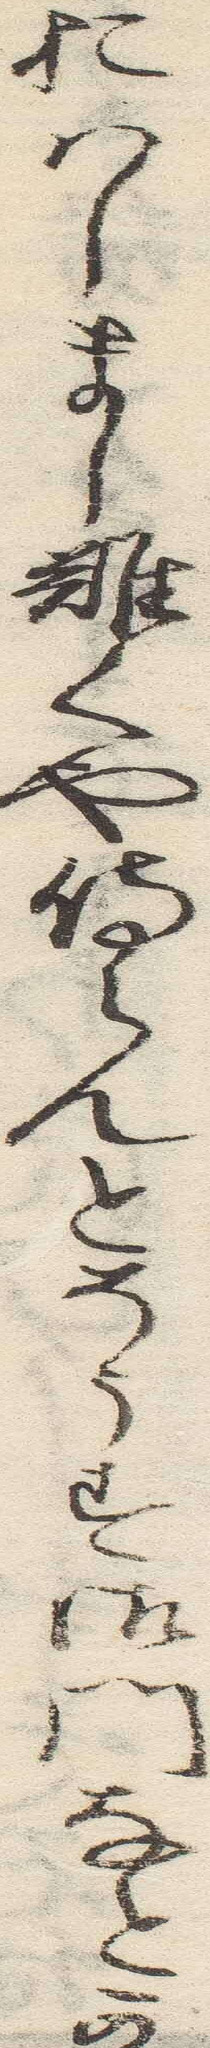おはしまし難くや侍らんとそうす御門なとか
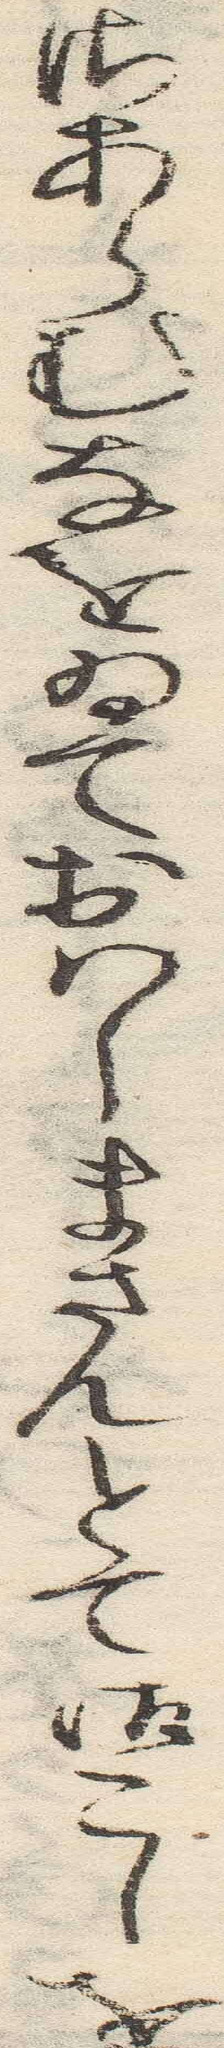さあらむなをゐておはしまさんとて御こしを
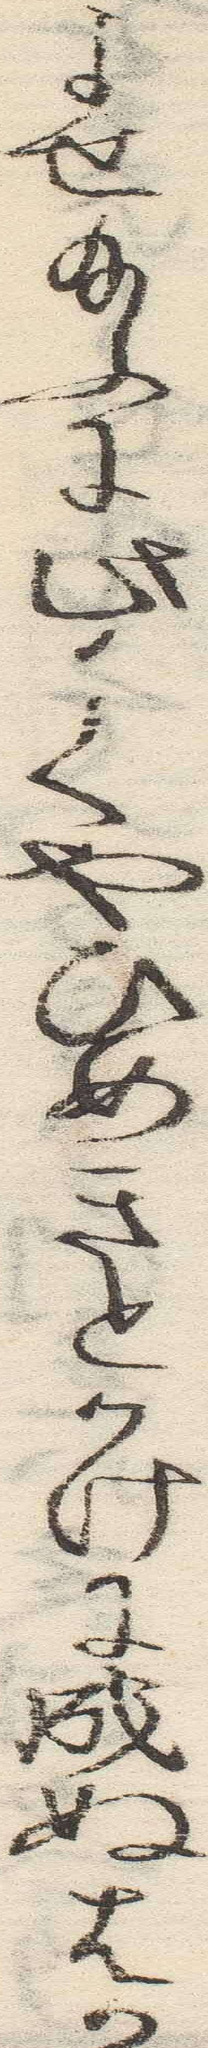よせ給ふに此かくやひめきとかけに成ぬはか
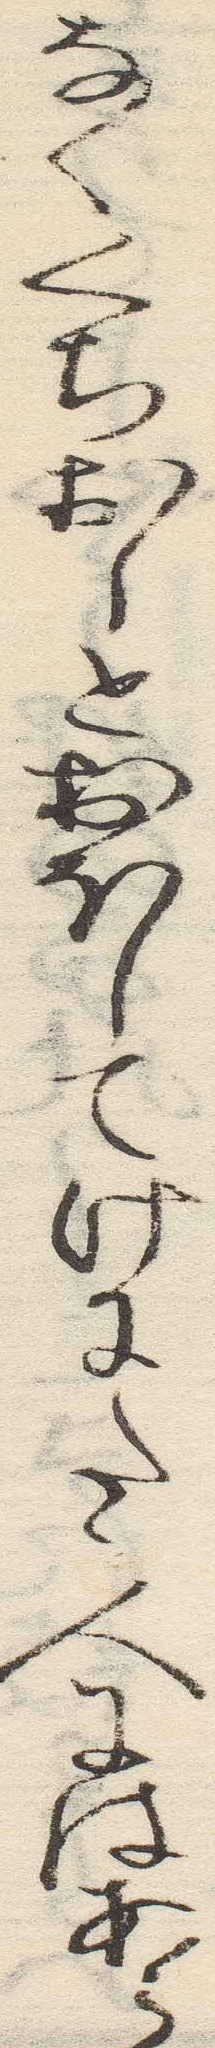なくくちおしとおほしてけにたゝ人にはあら
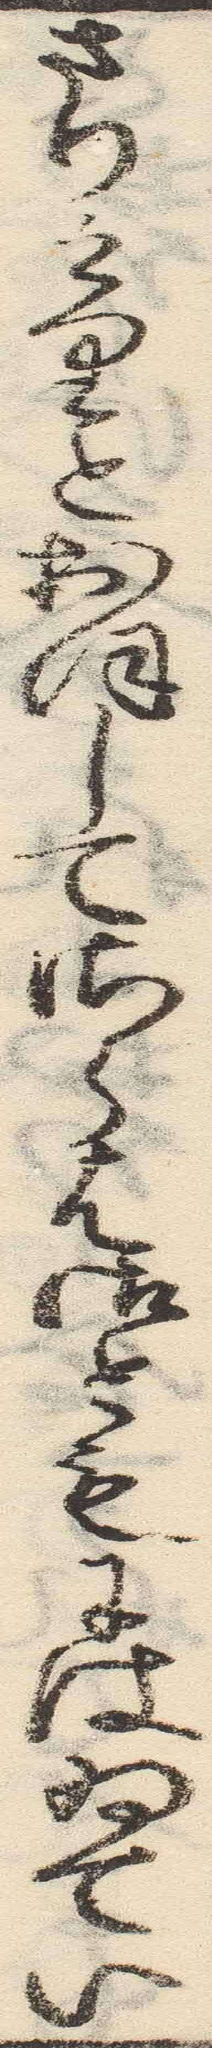さりけることおほしてさらは御ともにはゐてい
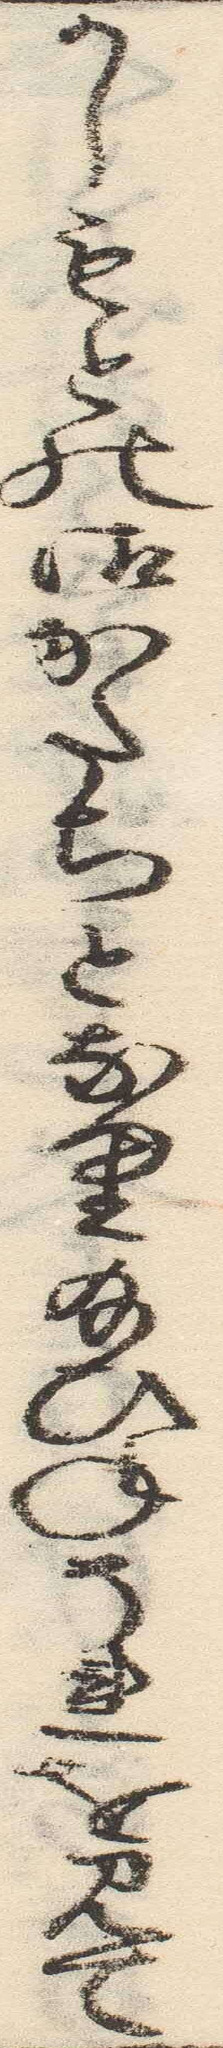かしもとの御かたちとなり給ひねそれを見て
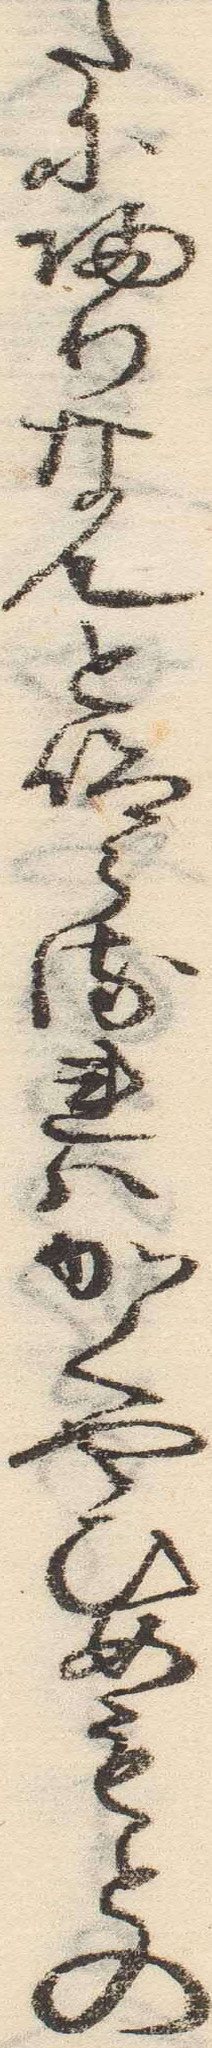たにかえりなんと仰らるれはかくやひめもとの
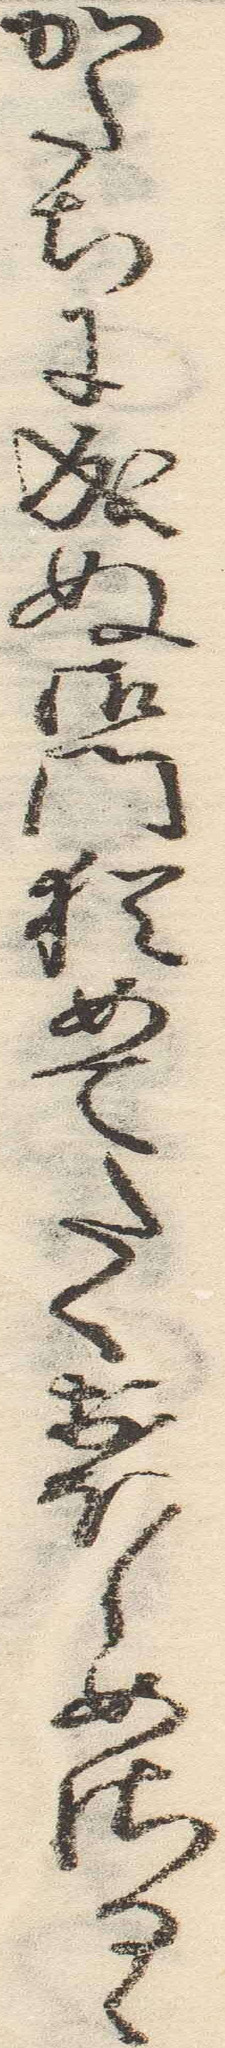かたちに成ぬ御門猶めてたくおほしめさるゝ
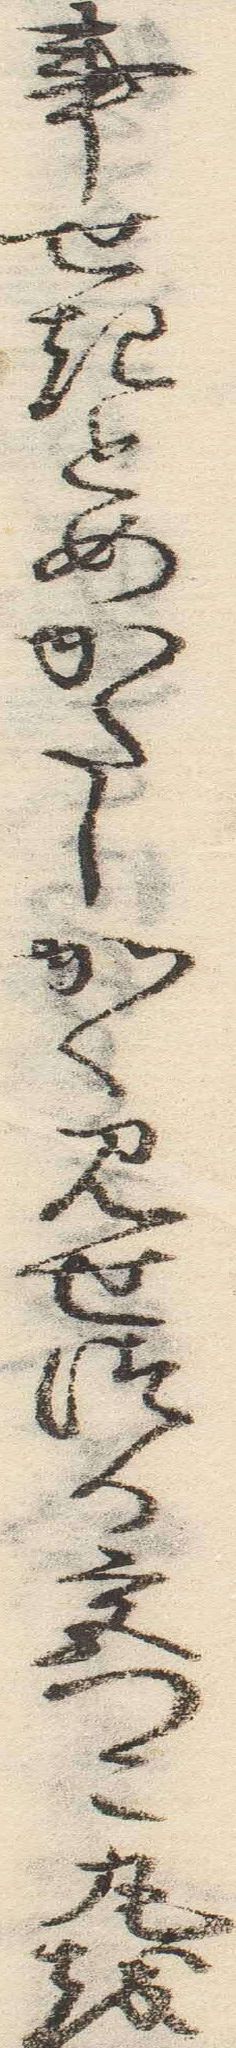事せきとめかたしかく見せつる宮つこ丸を
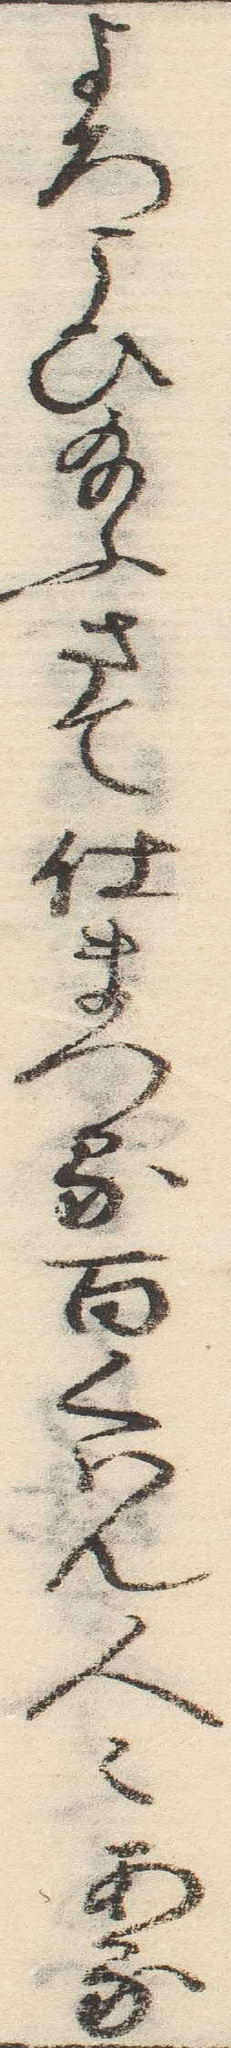よろこひ給ふさて仕まつる百くはん人々ある
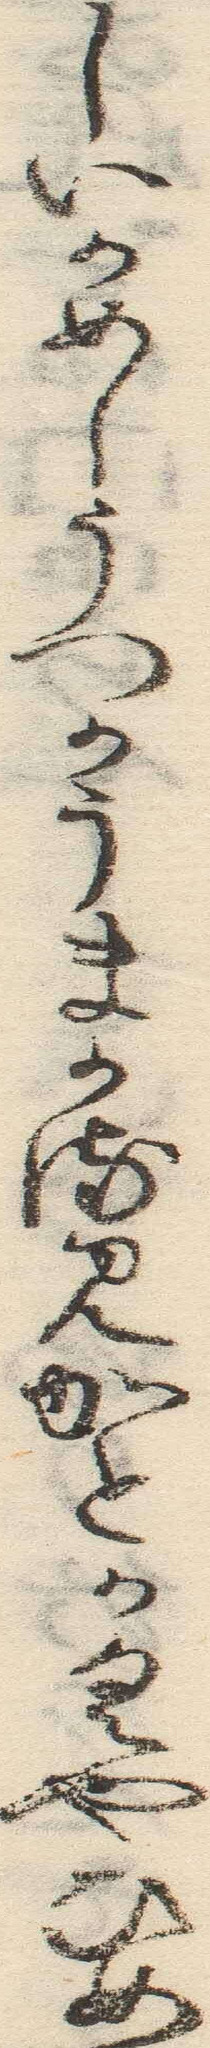しいかめしうつかうまかるみかとかくやひめ
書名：竹取物語
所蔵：東京学芸大学附属図書館 国文学研究資料館
